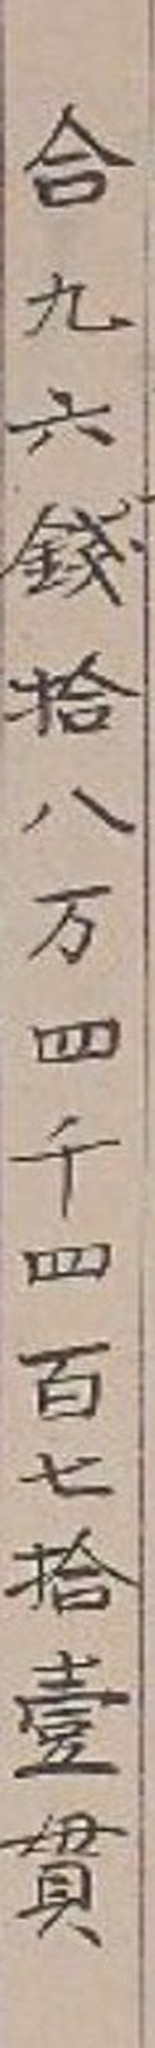合九六錢拾八万四千四百七拾壹貫
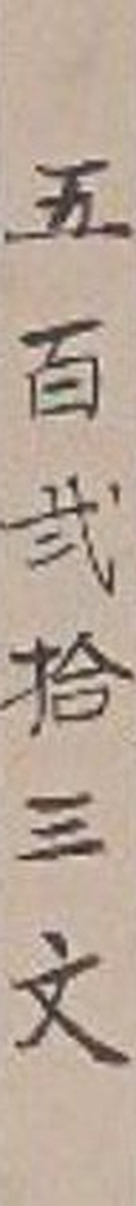五百弐拾三文

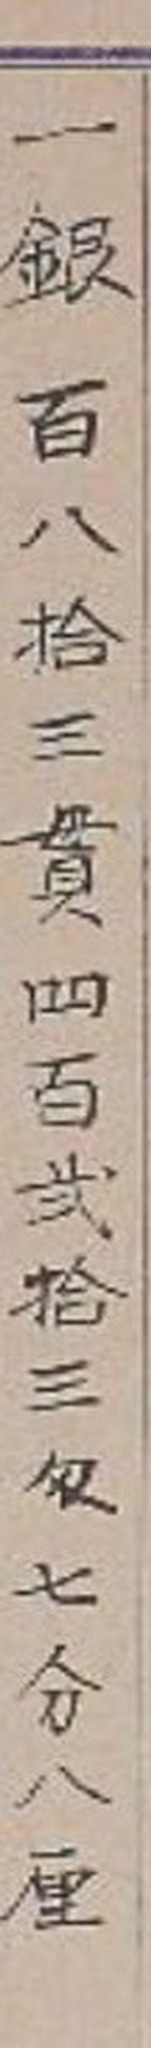一銀百八拾三貫四百弐拾三匁七分八厘
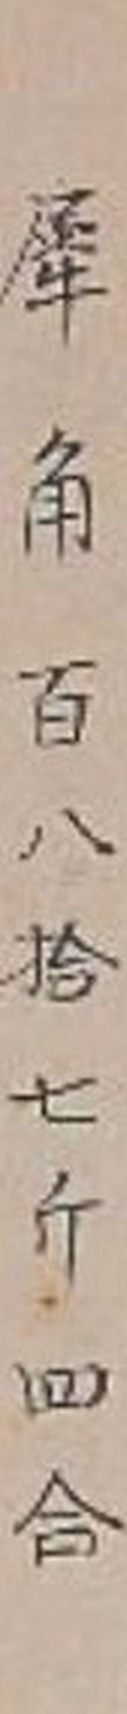犀角百八拾七斤四合
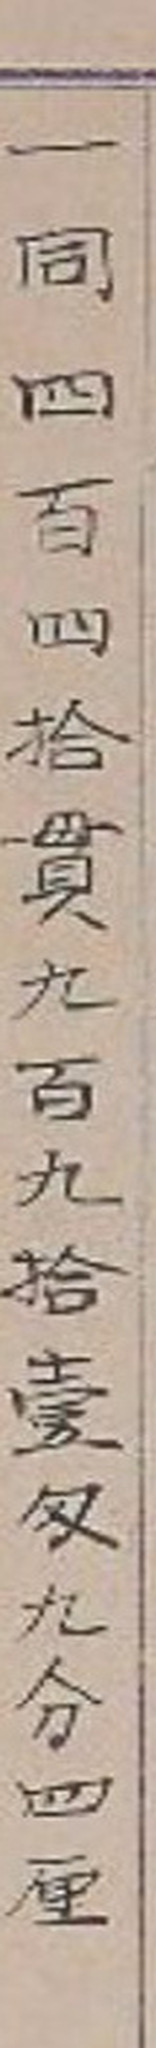一同四百四拾貫九百九拾壹匁九分四厘
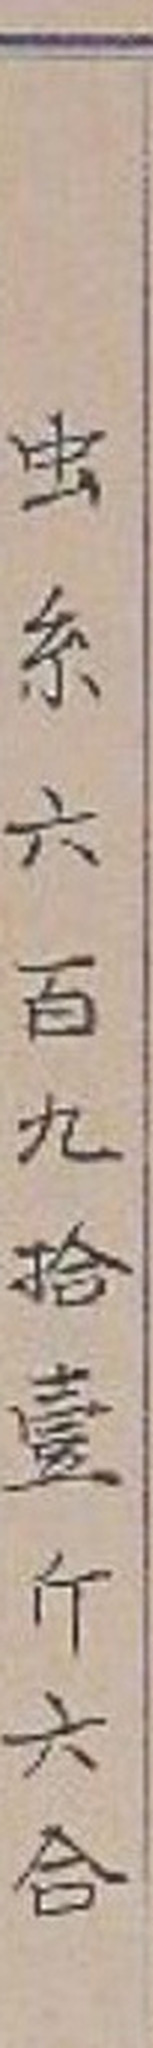虫糸六百九拾壹斤六合
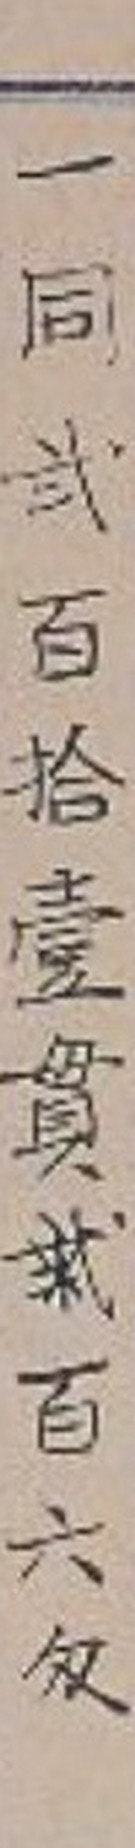一同弐百拾壹貫弐百六匁
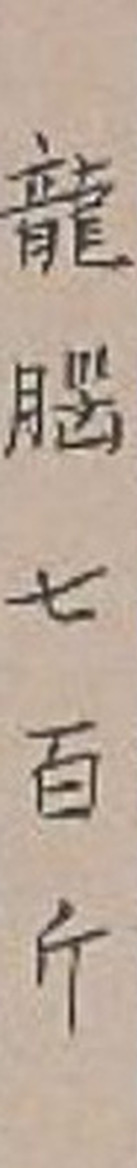龍腦七百斤
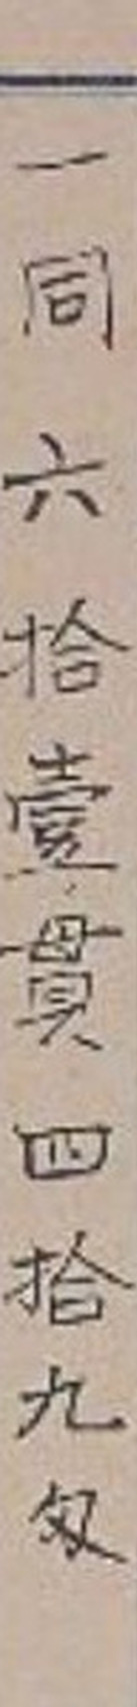一同六拾壹貫四拾九匁
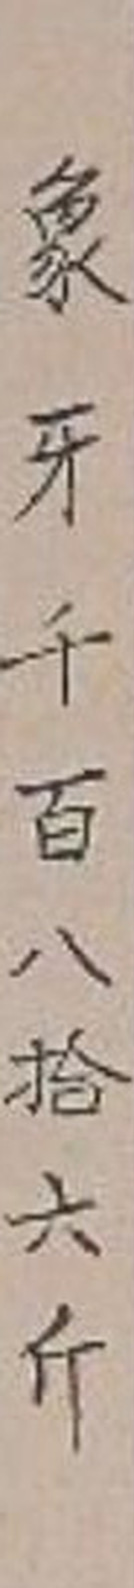象牙千百八拾六斤
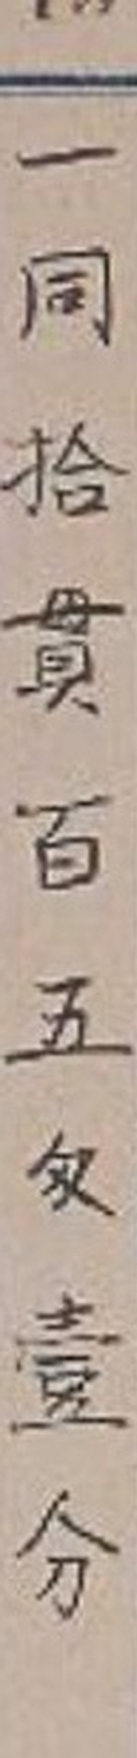一同拾貫百五匁壹分
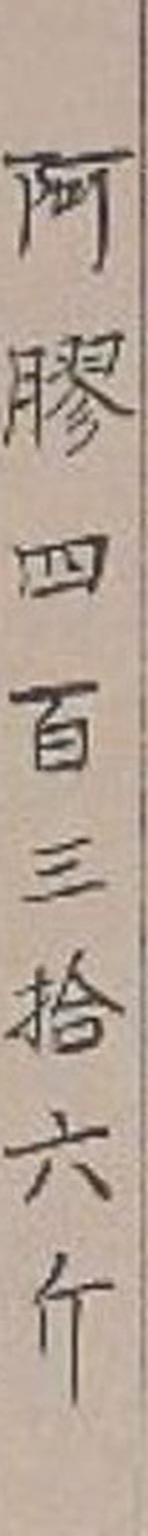阿膠四百三拾六斤

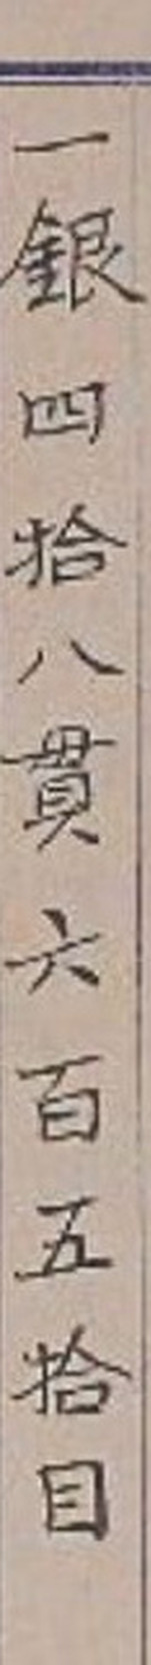一銀四拾八貫六百五拾目
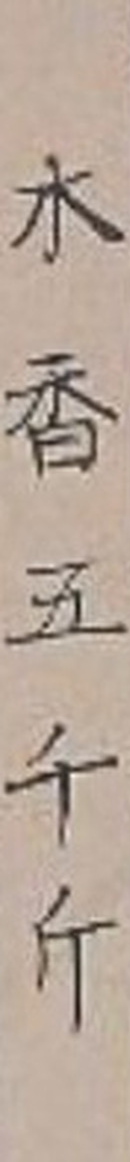木香五千斤
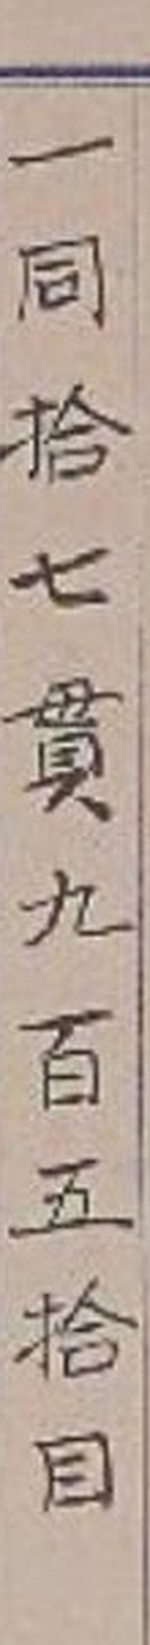一同拾七貫九百五拾目
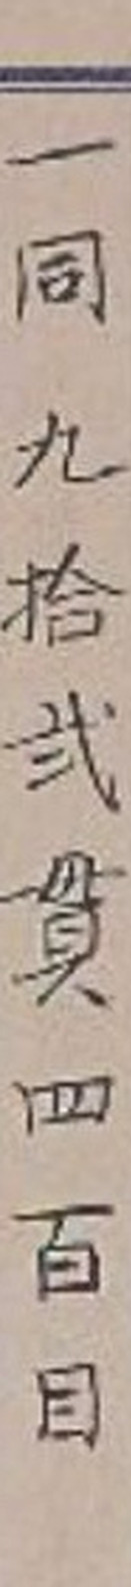一同九拾弐貫四百目
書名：琉球産物於長崎拂立並本手品利潤総帖 弘化四年より酉年迄
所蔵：University of the Ryukyus Library
